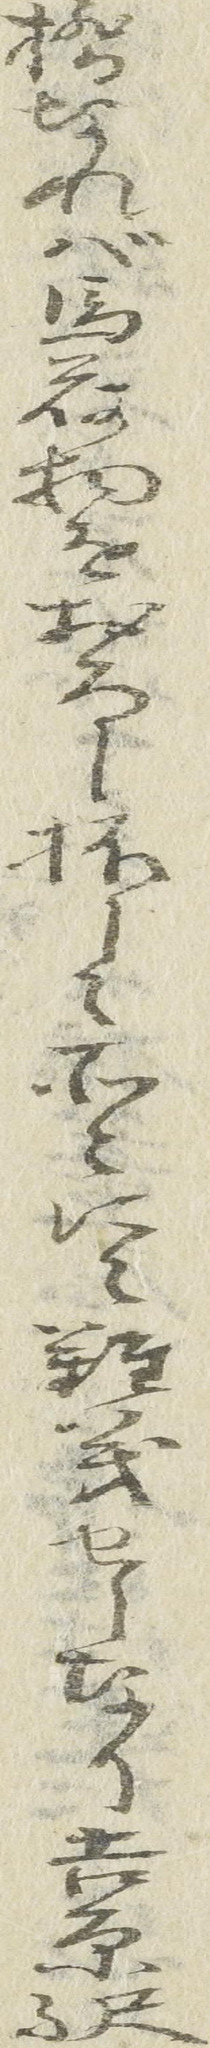橋なれバ馬荷物をおろし抔して所々にて難義せしなり吉原駅
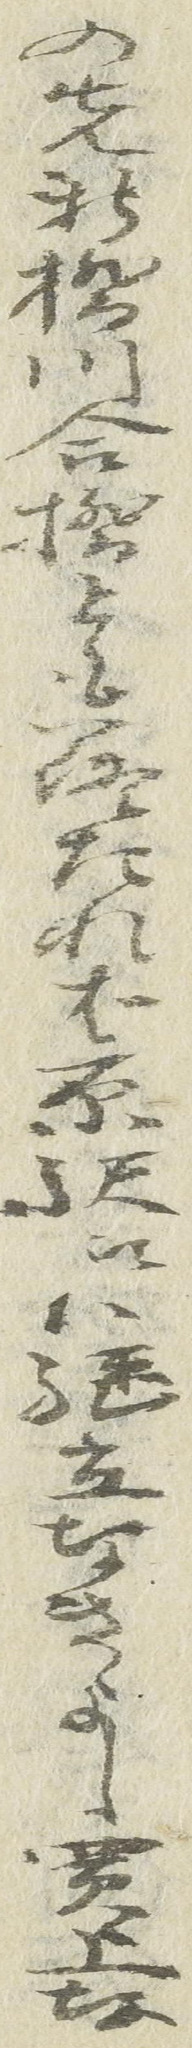の先新橋川合橋とも落たれば原駅えハ継立なきよし買上な
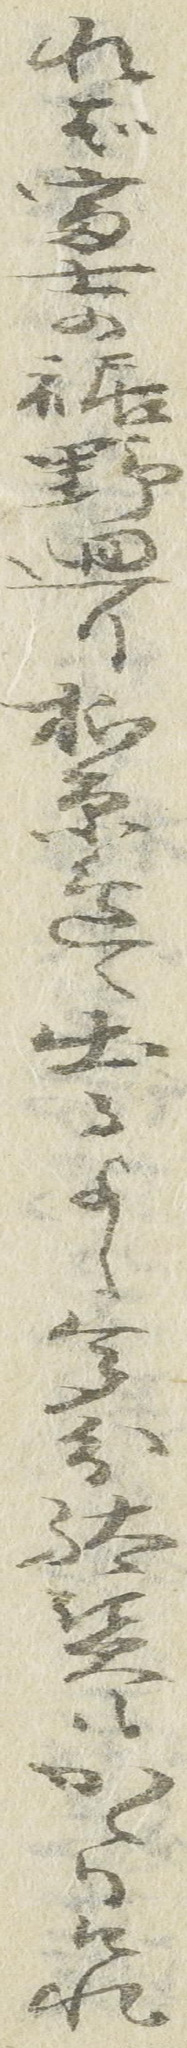れば富士の裾野廻り柏原邊へ出るよし多分駄賃もかゝりけれ
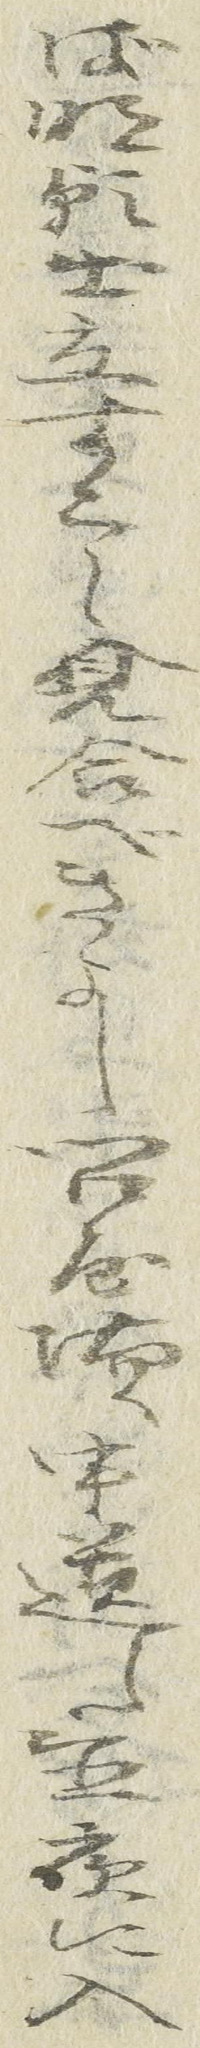ば明朝出立すこし見合べきよし問屋場へ申送し置夜に入
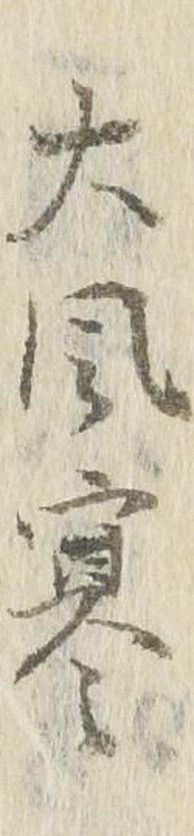大風寒

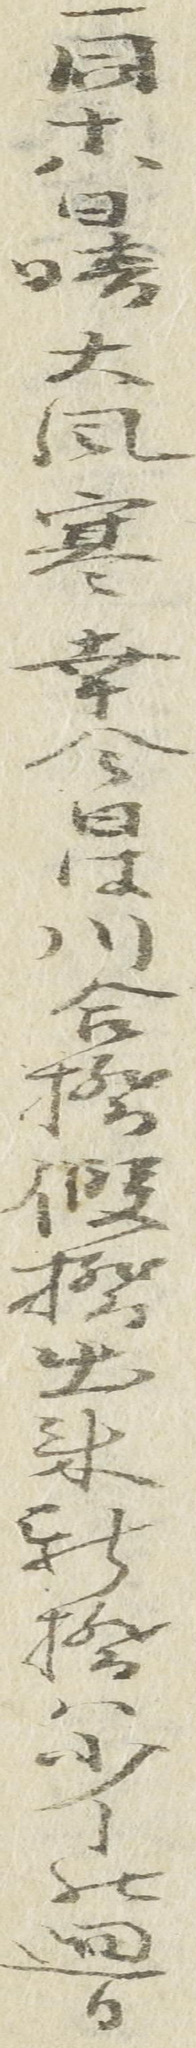一同十八日晴大風寒幸今日は川合橋仮橋出来新橋ハ少しの廻り
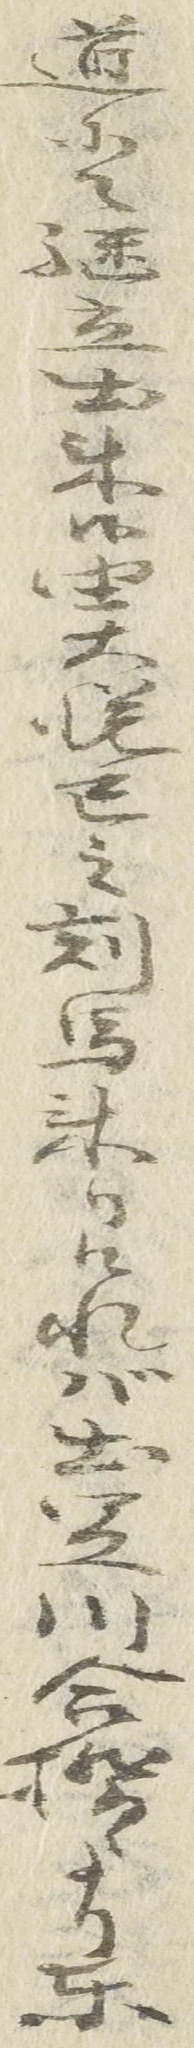道にて継立出来候由大悦巳之刻馬来りければ出足川合橋より東
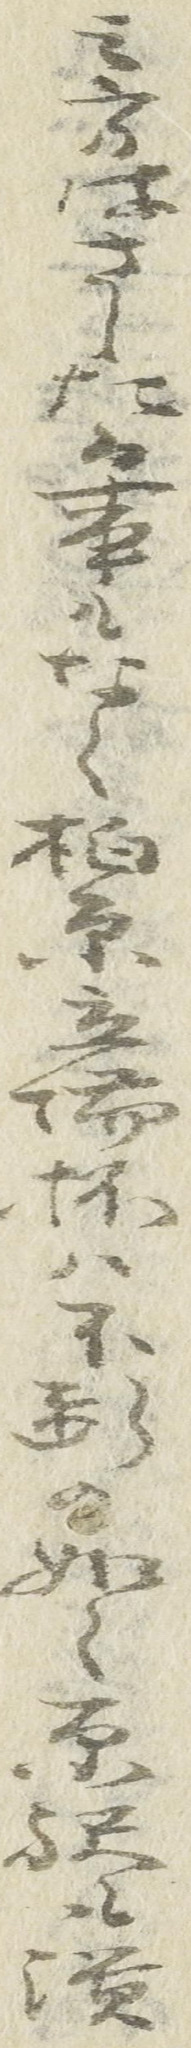之方はさしたる事もなく柏原立場抔は不断の如く原駅も潰
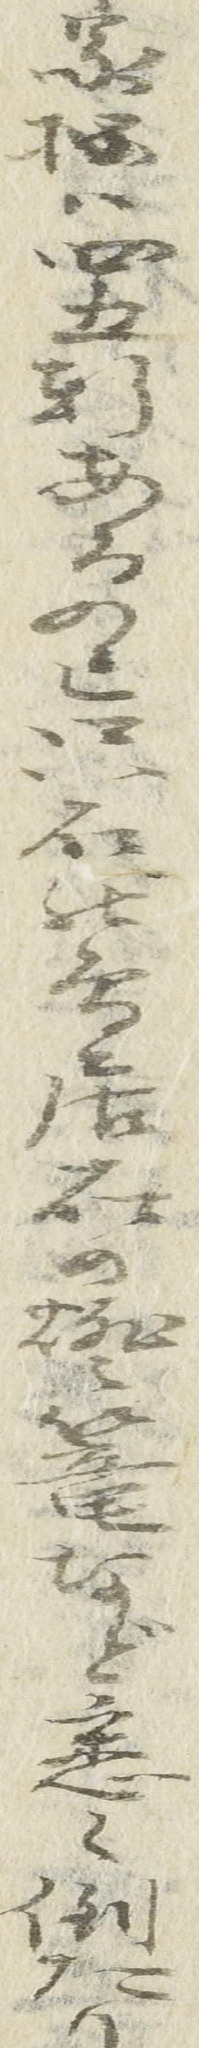家抔は四五軒あるのみ只石の鳥居石の燈篭など悉く倒たり
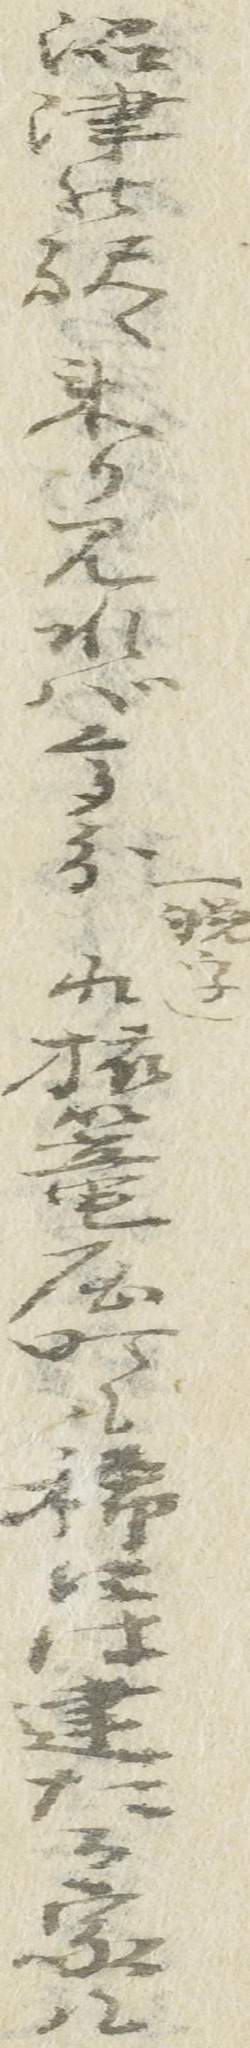沼津の駅へ来り見れば多分れ旅篭屋町も稀には建たる家も
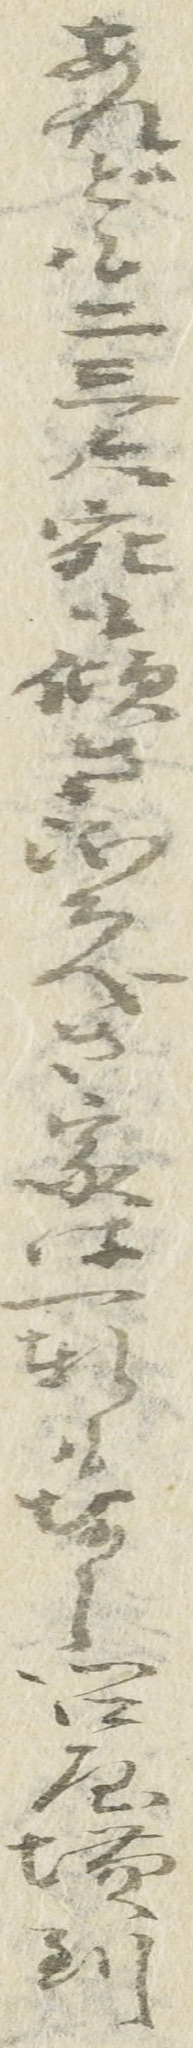あれども二三尺宛も傾き泊るべき家は一軒もなし問屋場到
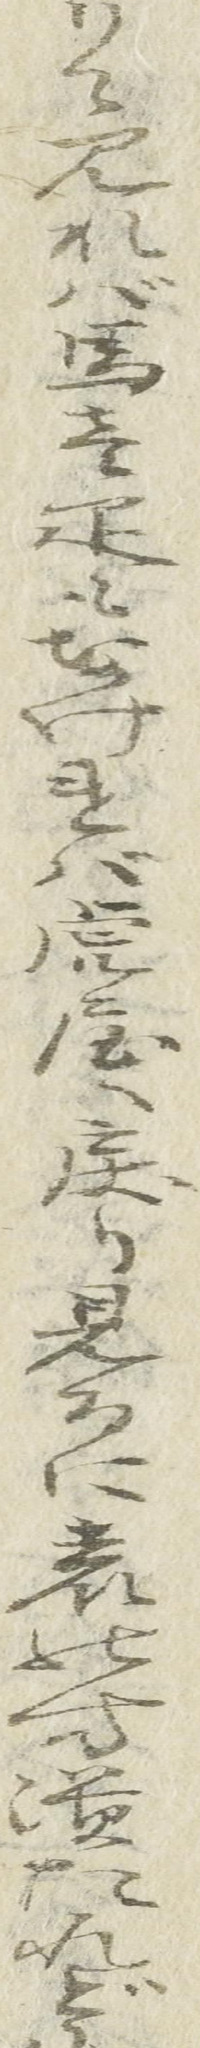りて見れバ馬壱疋もなけれバ虎屋へ戻り見るに表の方潰たれども
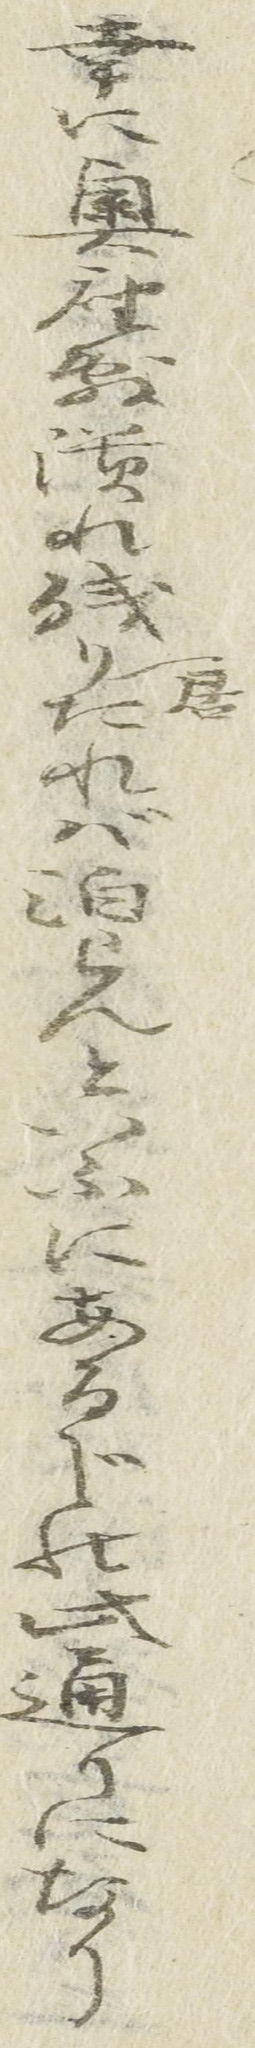幸に奥座敷潰れ残りたれバ泊らんといふにあるじの此通りになり
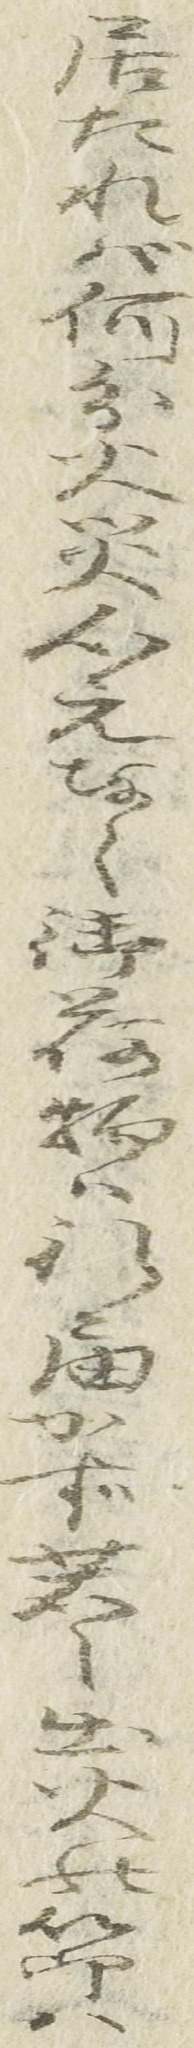居たれバ何分火災心元なく御荷物ハ行届かず若し出火の節ハ
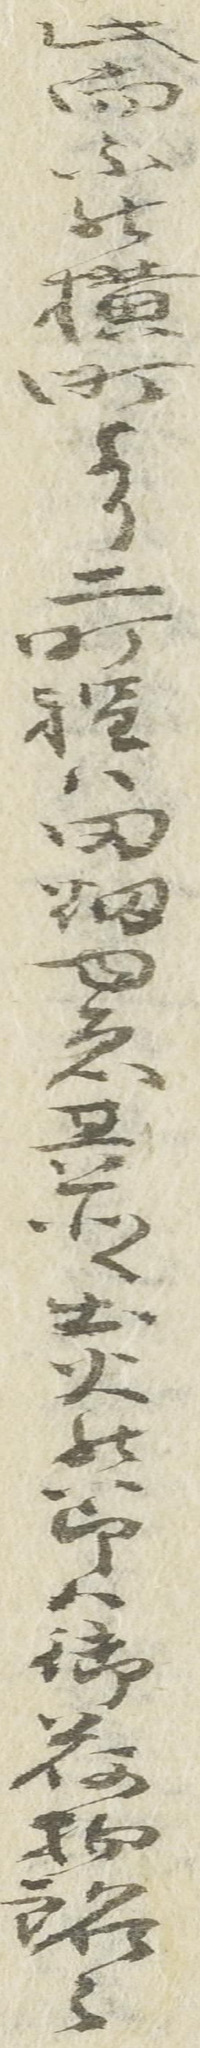此向ふの横町より二町程ハ田畑ゆゑ其所へ出火の節ハ御荷物銘々
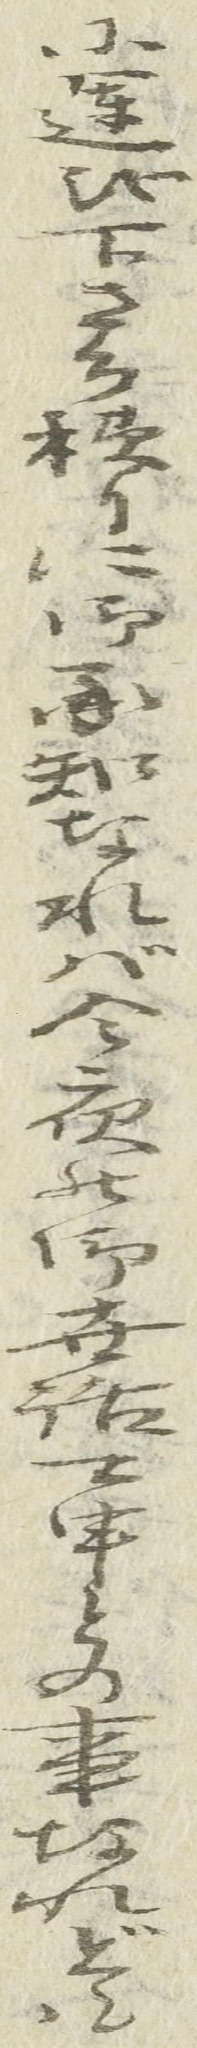に運び下さる積りに御承知なれバ今夜の御世話可申との事なれども
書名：地震前兆集　全
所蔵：東京大学地震研究所図書室 Earthquake Research Institute Library, The University of Tokyo, JAPAN
